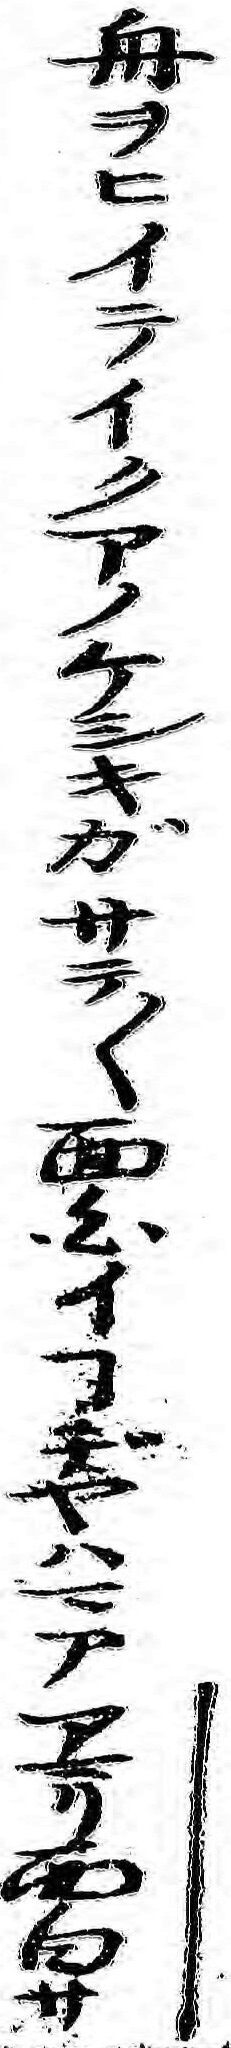舟ヲヒイテイクアノケシキガサテ〳〵面白イコトヂヤハマアアマリ面白サ
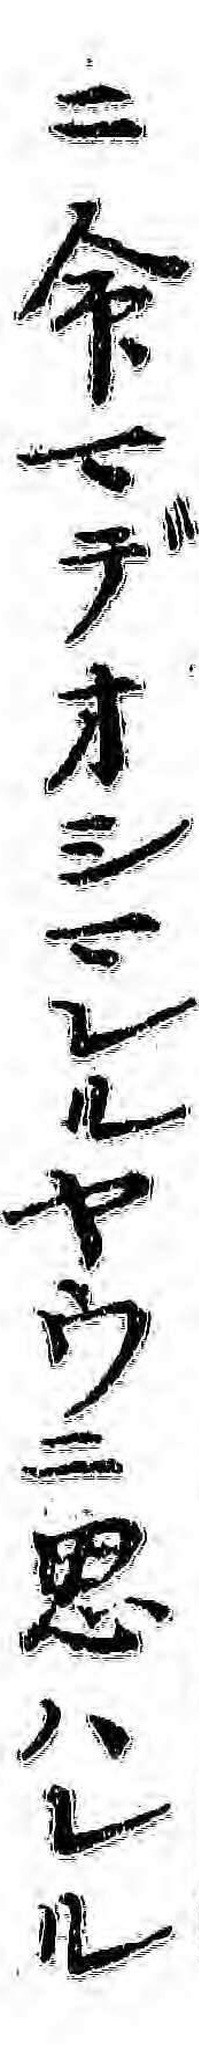ニ命マデオシマレルヤウニ思ハレル
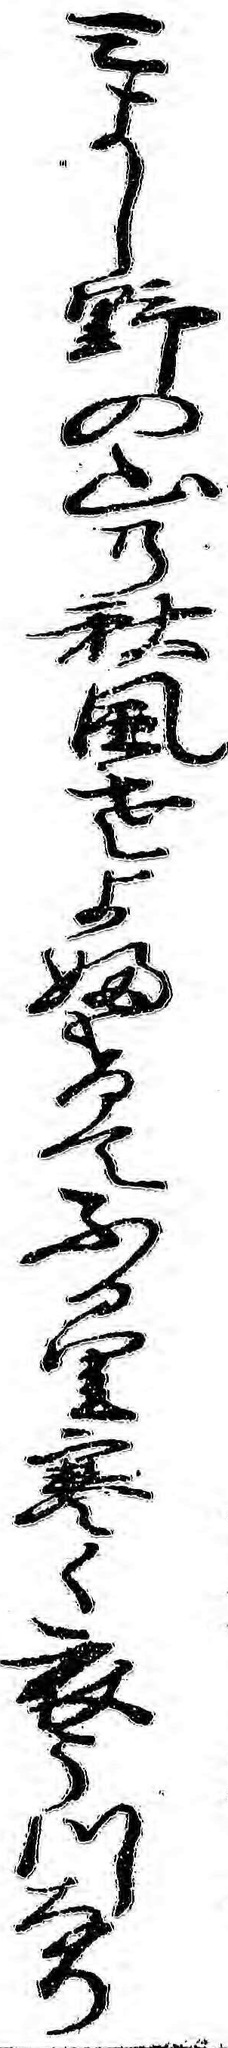みよし野の山の秋風さよふけてふる里寒く衣うつなり
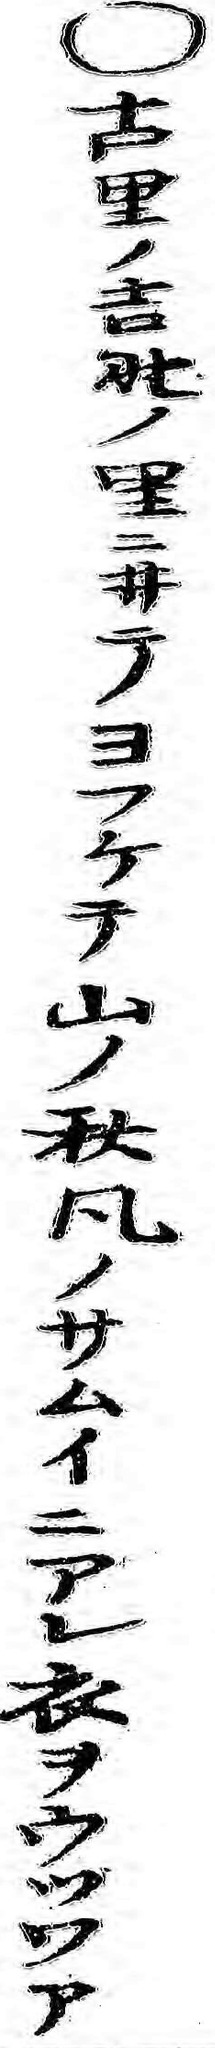◯古里ノ吉野ノ里ニヰテヨフケテ山ノ秋風ノサムイニアレ衣ヲウツワア
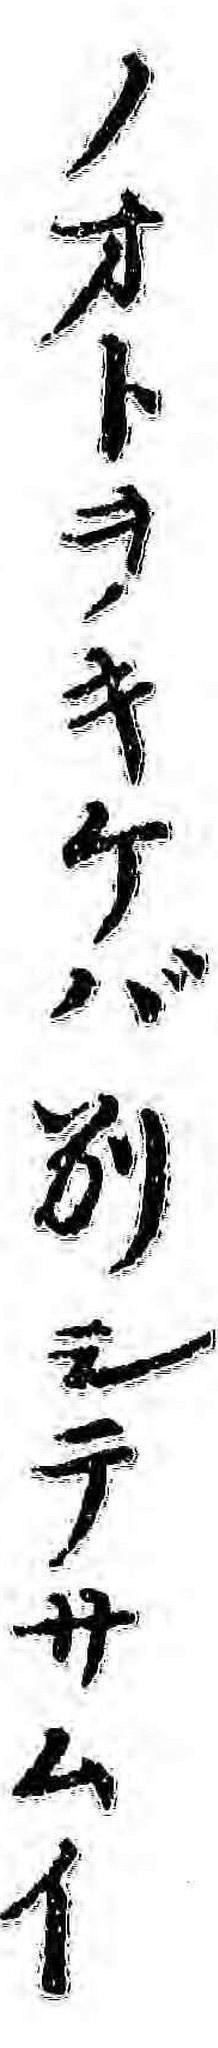ノオトヲキケバ別シテサムイ
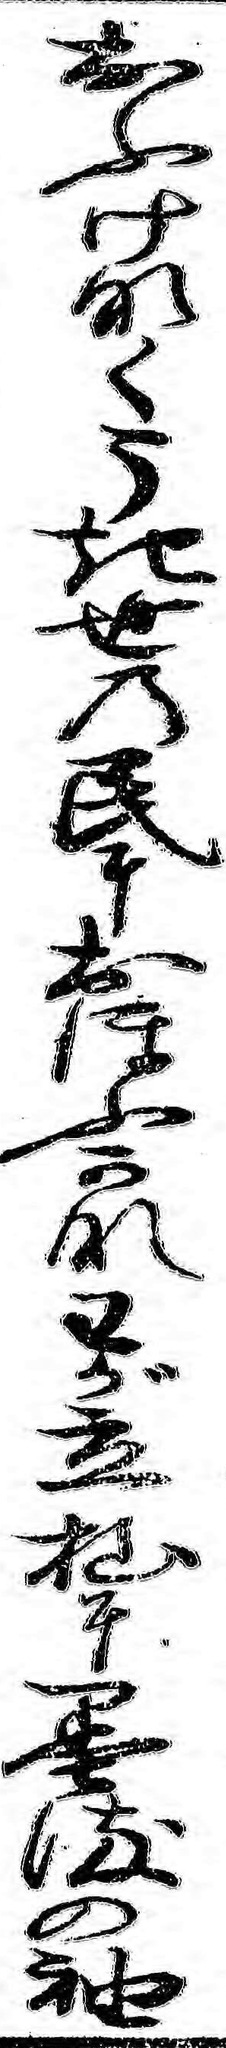おふけなくうき世の民におほふかなわが立杣に墨染の袖
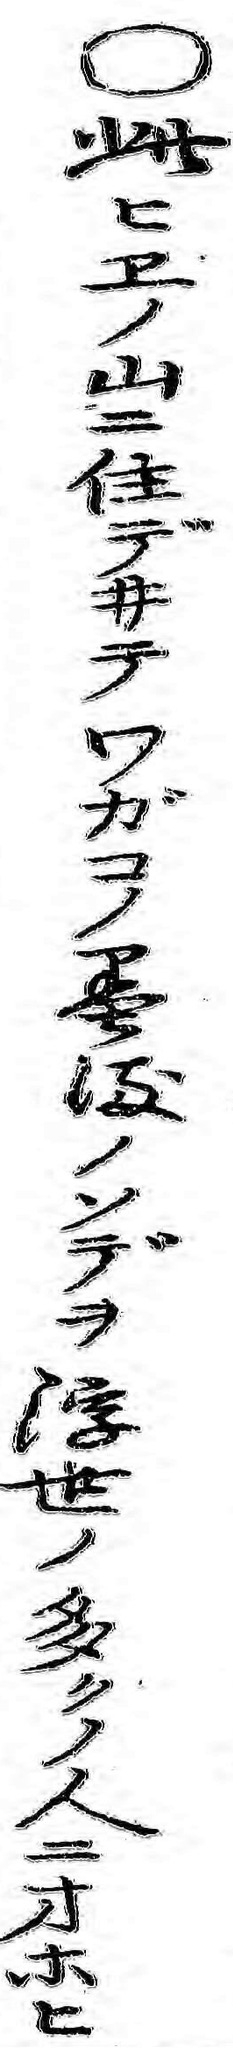◯此ヒヱノ山ニ住デヰテワガコノ墨染ノソデヲ浮世ノ多クノ人ニオホヒ
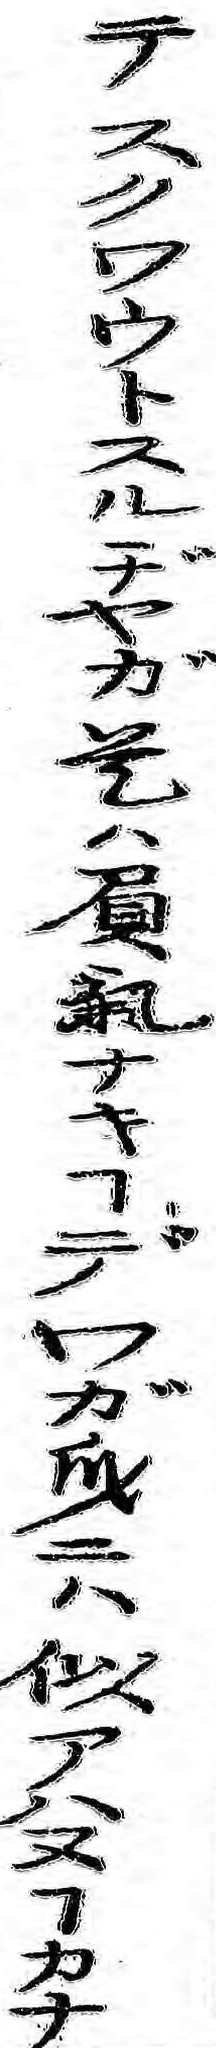テスクワウトスルヂヤガ是ハ屓気ナキコトデワガ身ニハ似アハヌコトカナ
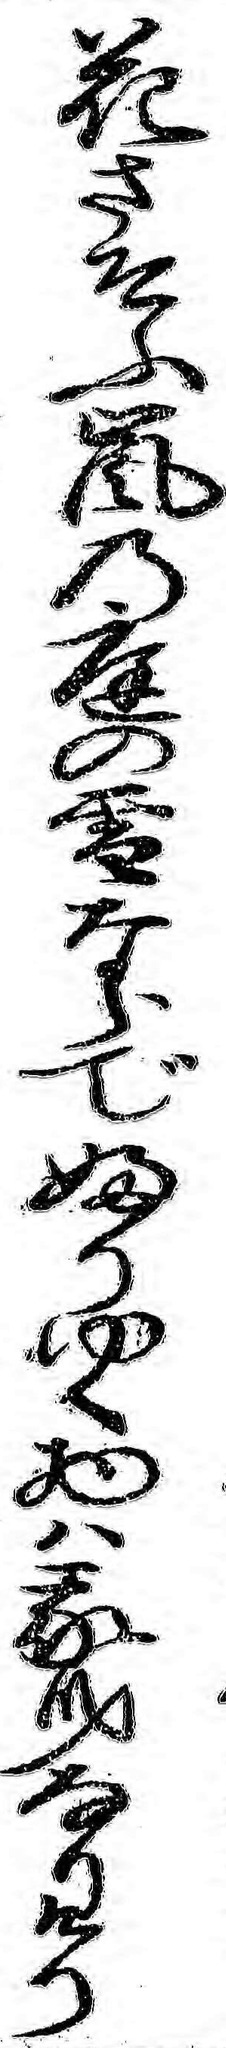花さそふ嵐の庭の雪ならでふりゆく物は我身なりけり
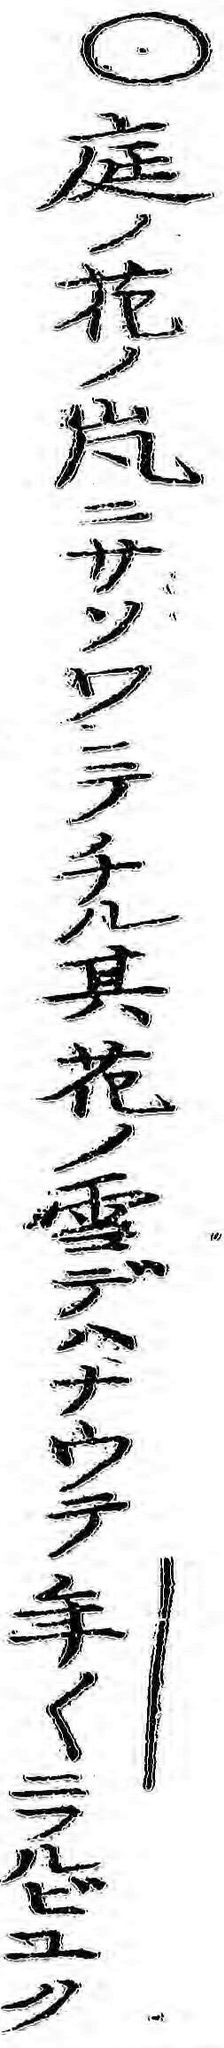◯庭ノ花ノ嵐ニサソワレテチル其花ノ雪デハナウテ年〳〵ニフルビユク
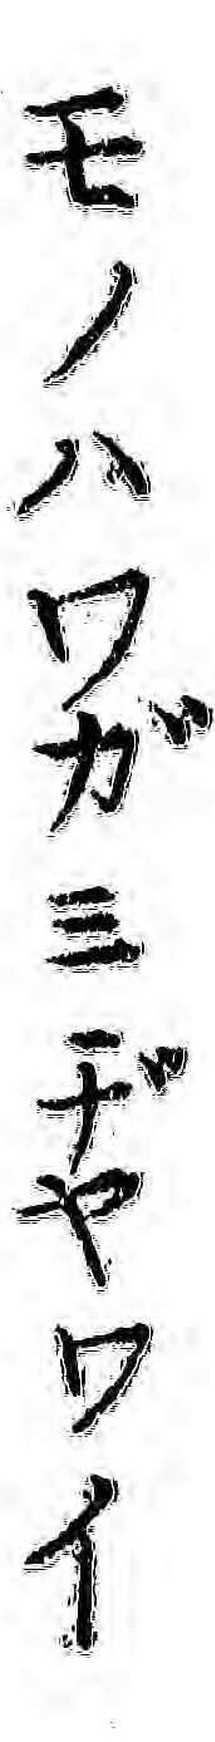モノハワガミヂヤワイ
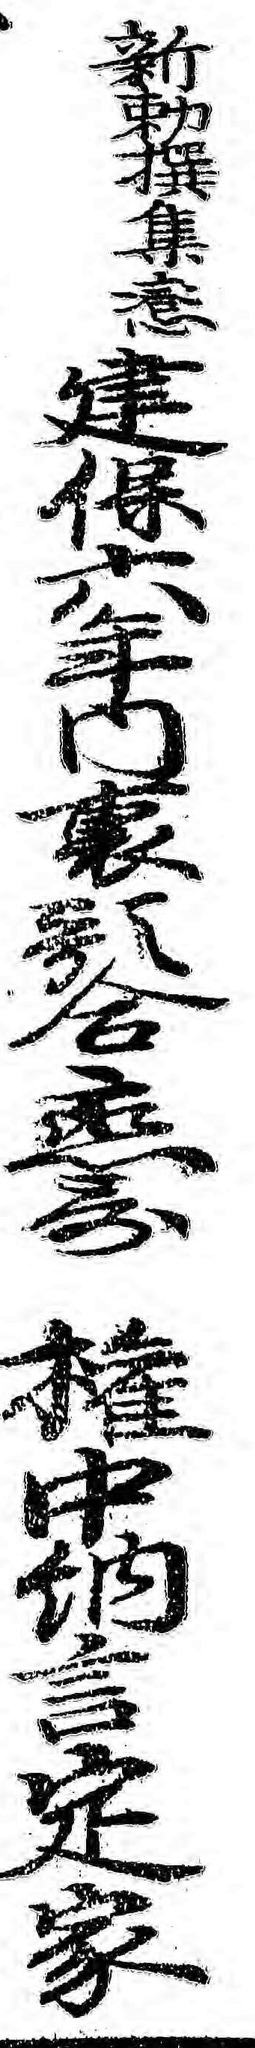新勅撰集恋建保六年内裏歌合恋哥権中納言定家
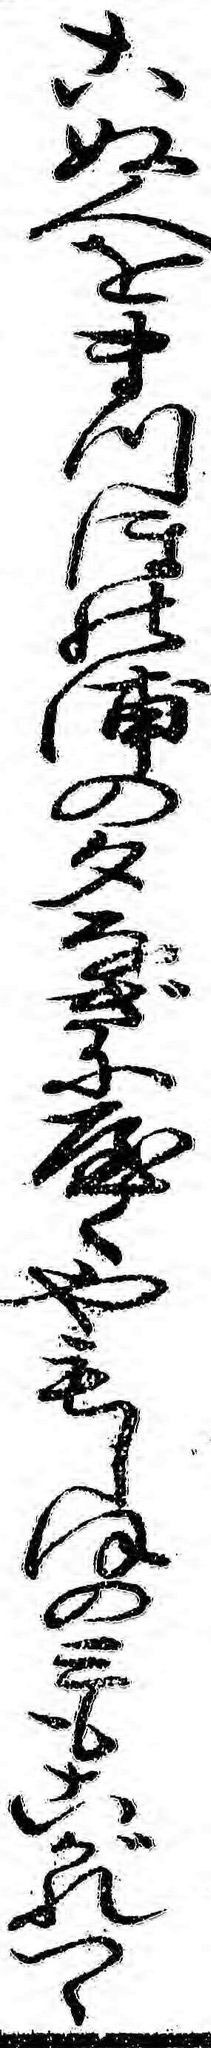こぬ人をまつほの浦の夕なぎにやくやもしほのみもこがれつゝ

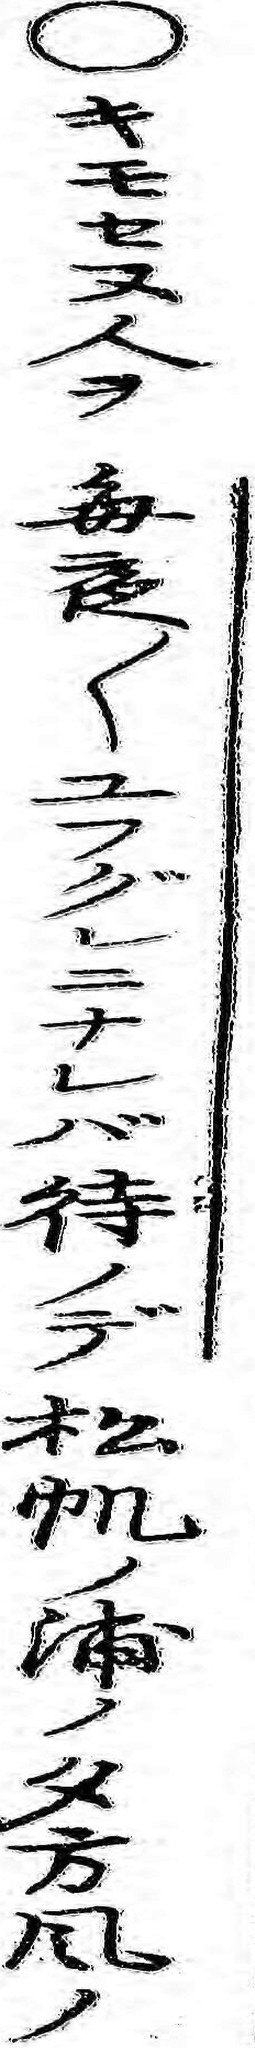◯キモセヌ人ヲ毎夜〳〵ユフグレニナレバ待ノデ松帆ノ浦ノ夕方風ノ
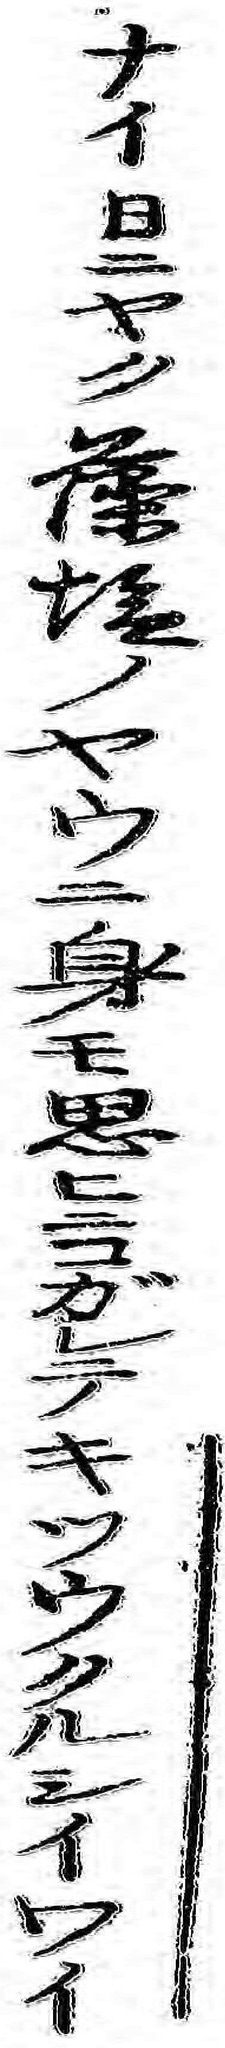ナイ日ニヤク藻塩ノヤウニ身モ思ヒコガレテキツウクルシイワイ
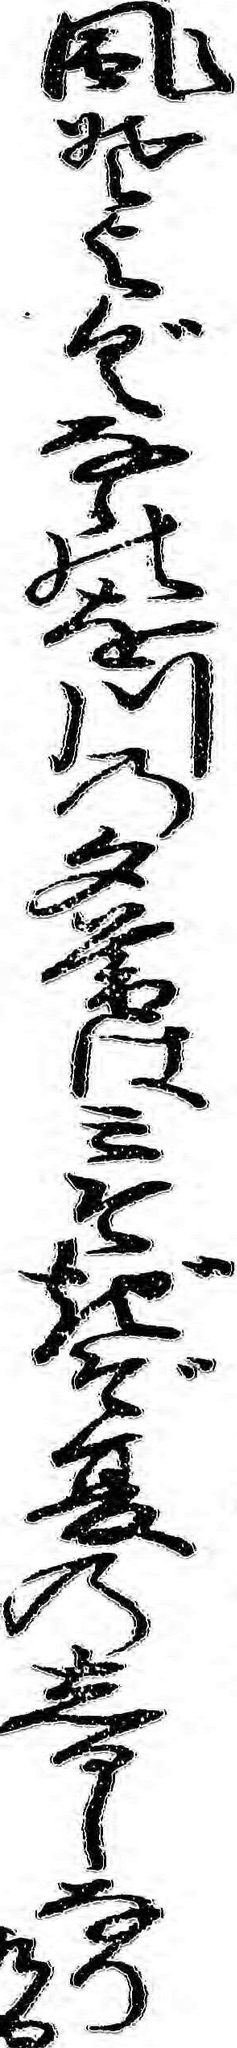風そよぐならのを川の夕暮はみそぎぞ夏のしるしなりける
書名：百人一首／小倉の山ふみ
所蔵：国文学研究資料館
